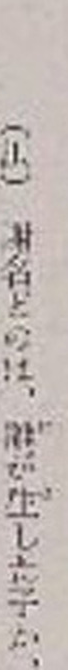(訳)謝名どのは、誰が生した子か、
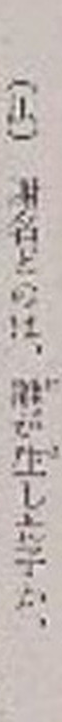(訳)謝名どのは、誰が生した子か、
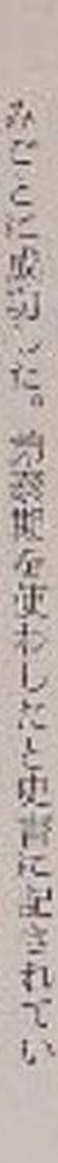みごとに成功した。弟泰期を使わしたと史書に記されてい
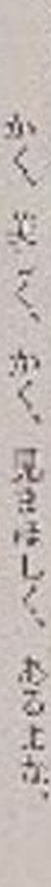かく、美しく、かく、見まほしく、あるよな、
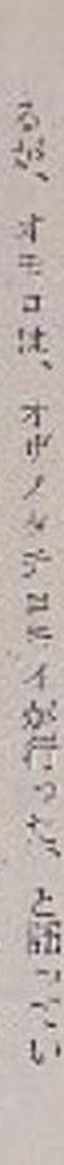るが、オモロは、オザノタチヨモイが行った、と謡ってい
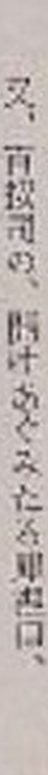又、百按司の、開けあぐみたる庫裡口、
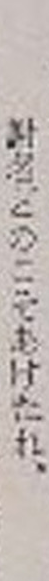謝名どのこそあけたれ、
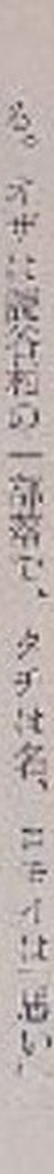る。オザは読谷村の一部落で、タチは名、ヨモイは「思い」
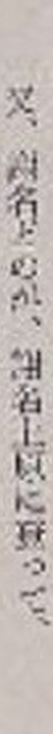又、謝名どのが、謝名上原に登って、
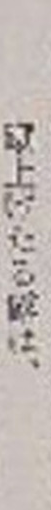蹴上げたる露は、
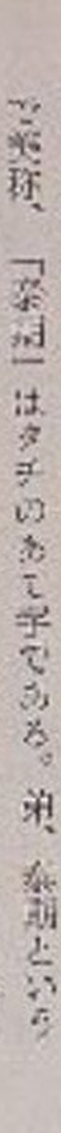で美称、「泰期」はタチのあて字である。弟、泰期という
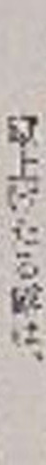蹴上げたる露は、
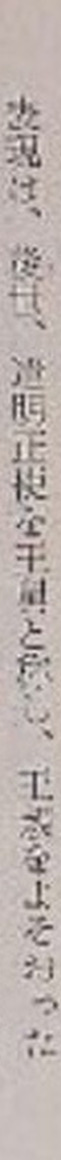表現は、後世、遣明正使を王と称し、王をよそおった
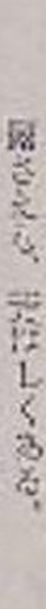露さえも、芳はしくある。
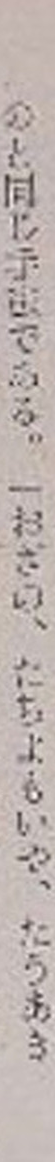のと同じ手法である。「おざの、たちよもいや、たうあき
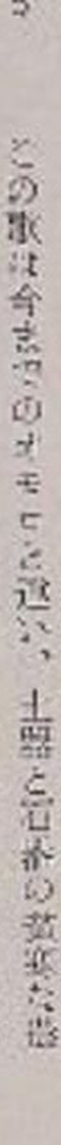この歌は今までのオモロと違い、土器と石器のた
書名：沖縄口承文芸
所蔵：University of the Ryukyus Library
